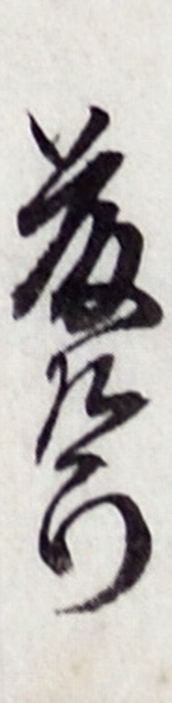藤左衛門
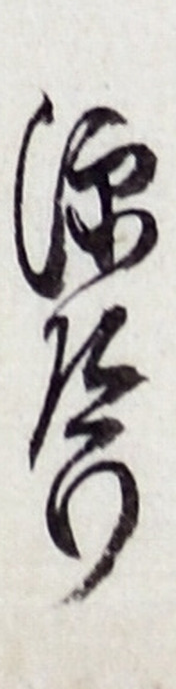源左衛門
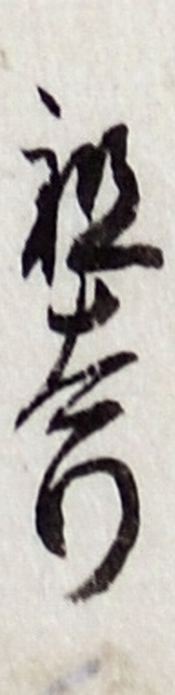弥次右衛門
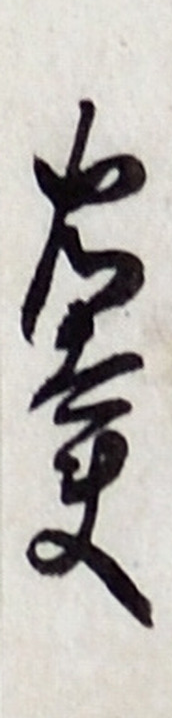忠太夫
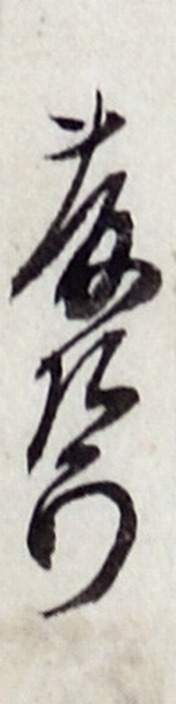藤左衛門
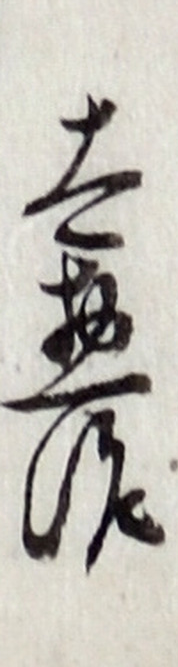太惣治
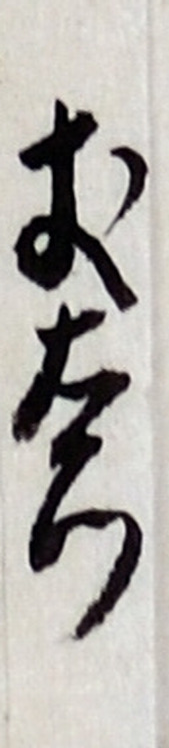弥次右衛門
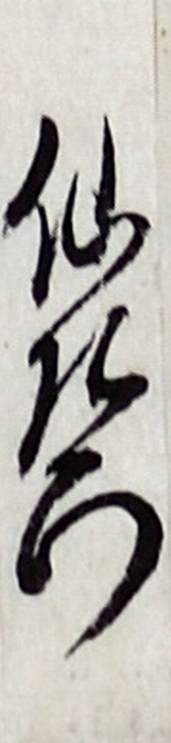源左衛門
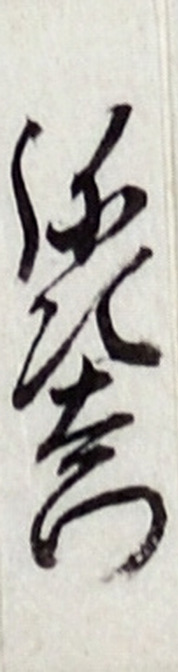弥次右衛門
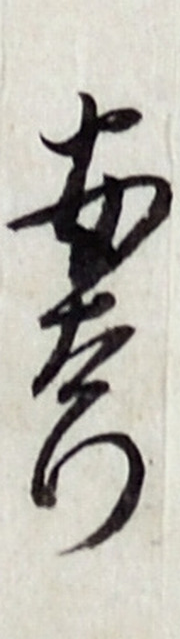安右衛門
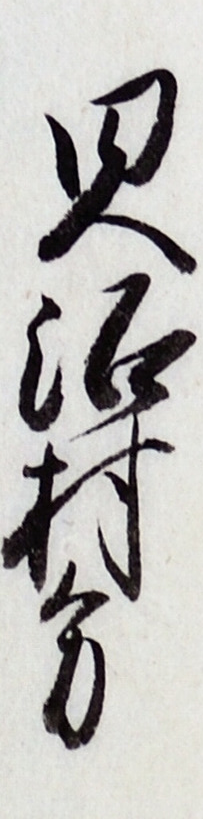貝沼村分
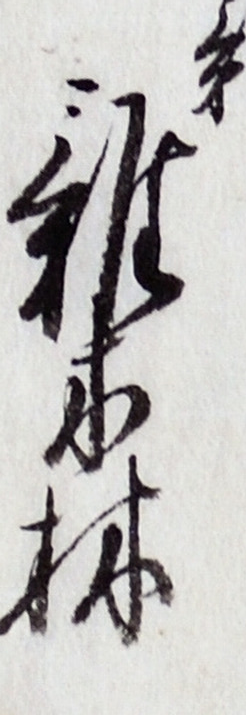雑木林
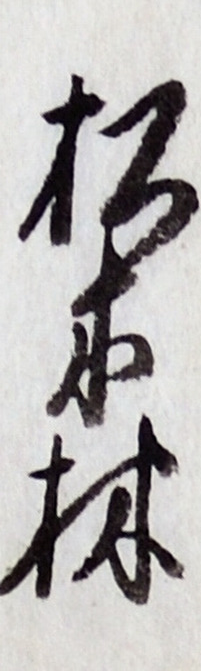雑木林
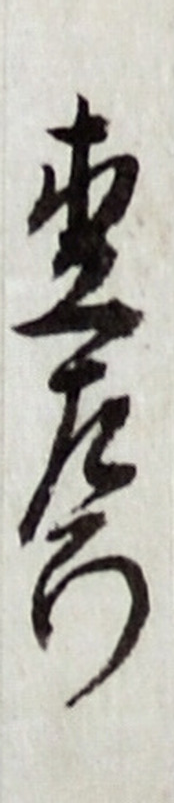源左衛門

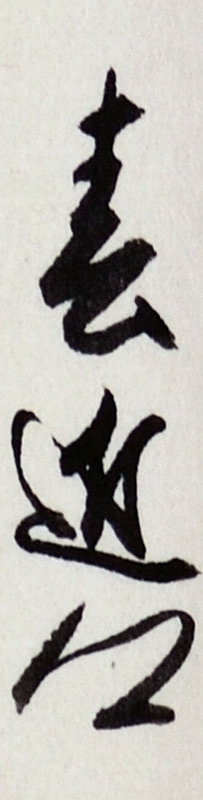春近郷
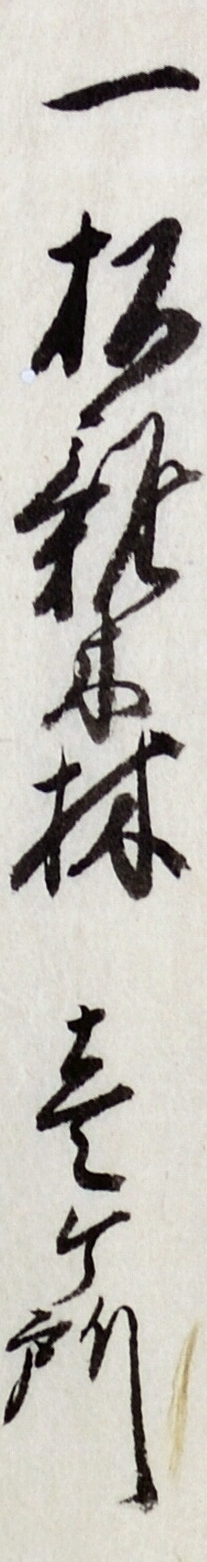一松雑木林壱ケ所
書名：御領分中御林御藪附帳
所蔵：伊那市立高遠町図書館・合同会社AMANE
